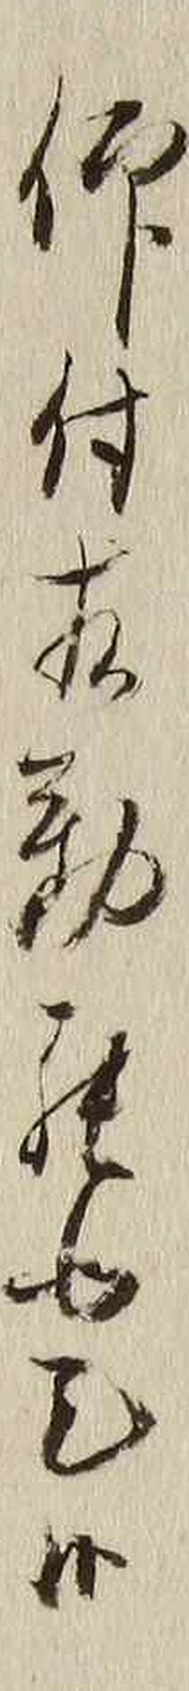仰付相勤罷登候
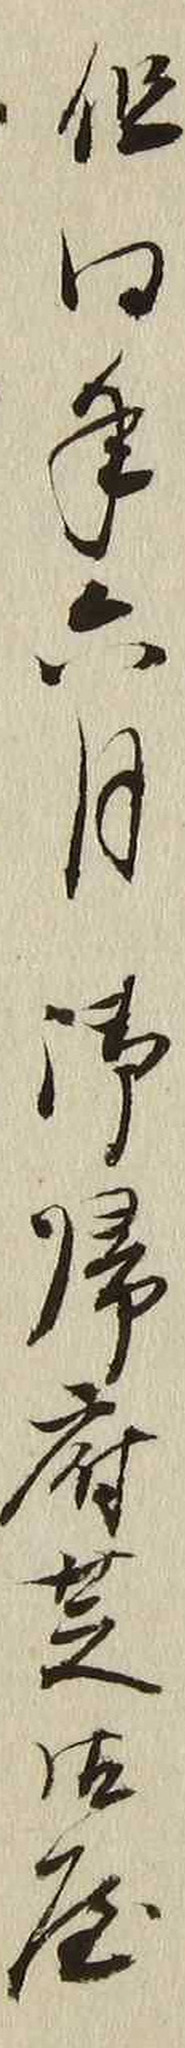但同年六月御帰府芝御屋
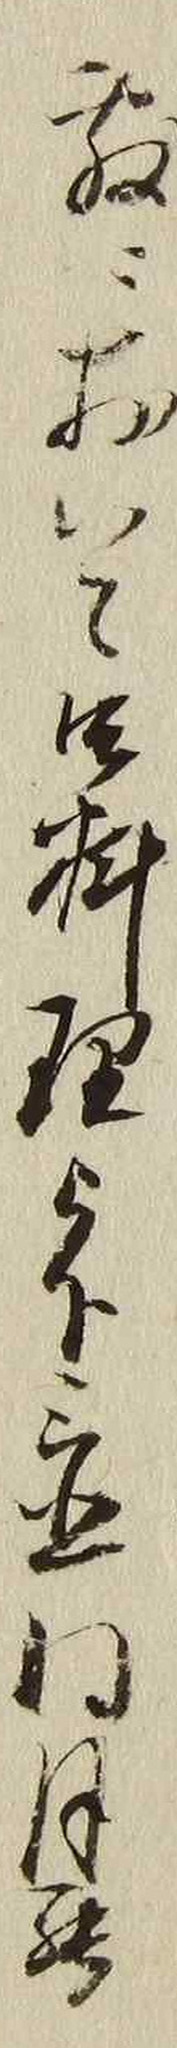敷ニおいて御料理被下置同月罷
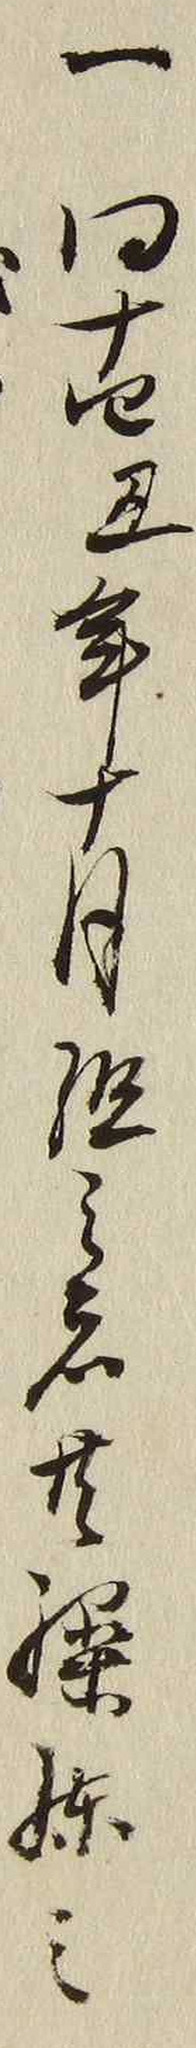一同十四丑年十月組之者共操練之
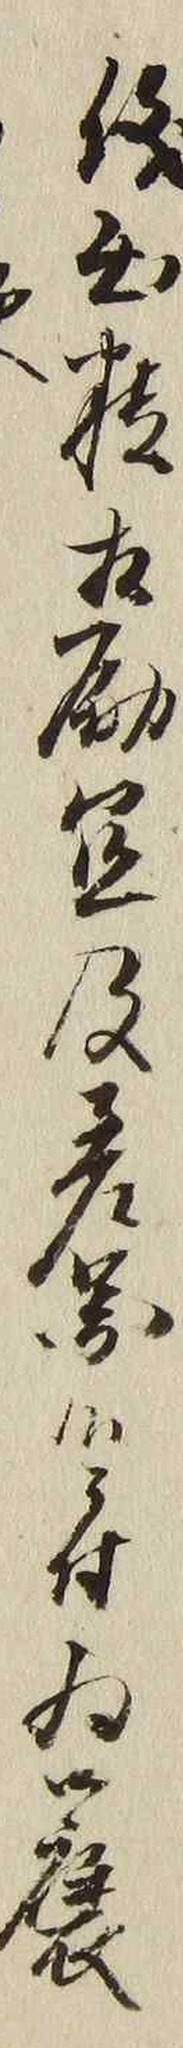儀出精相励宜及差図候ニ付為御褒
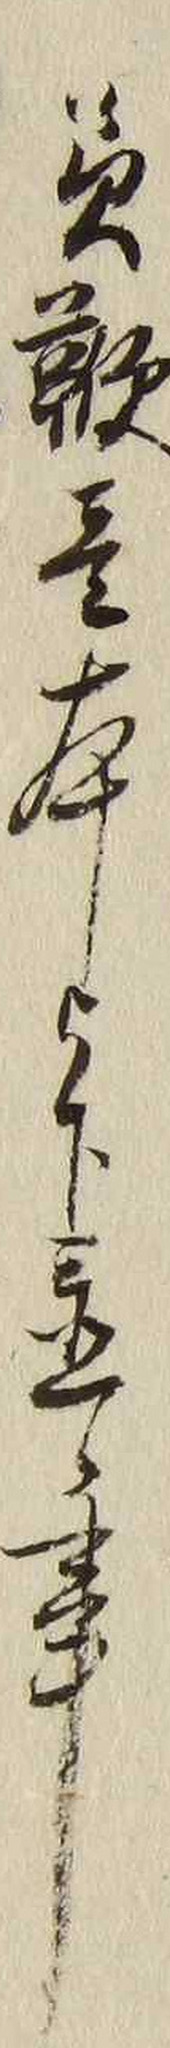美鞭壱本被下置候事
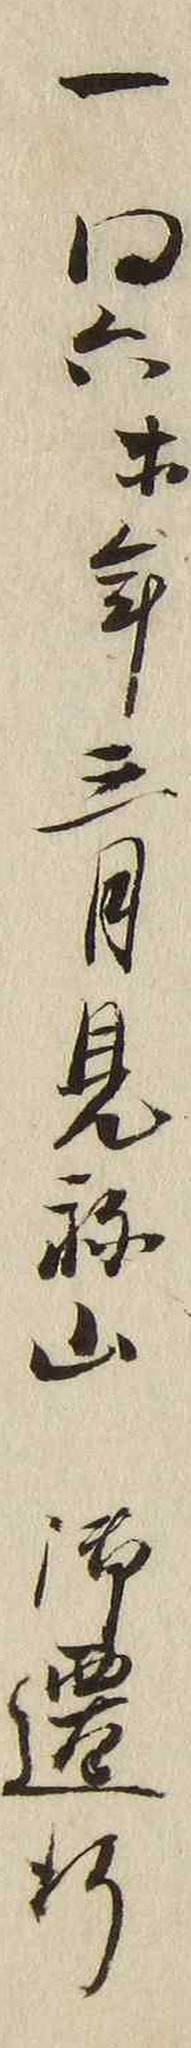一同六未年三月見禰山御遷行

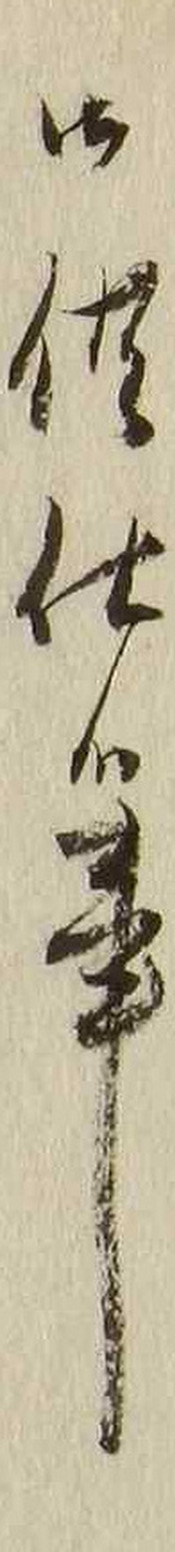御供仕候事
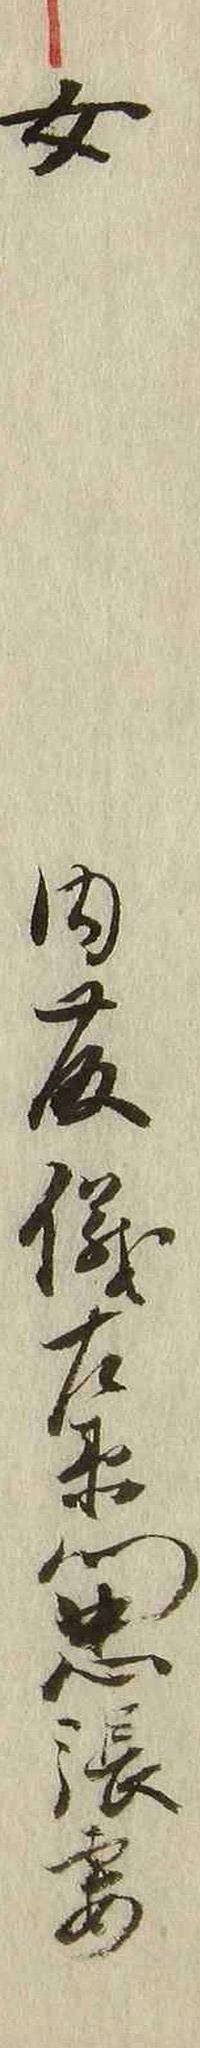女内藤儀左衛門忠張妻
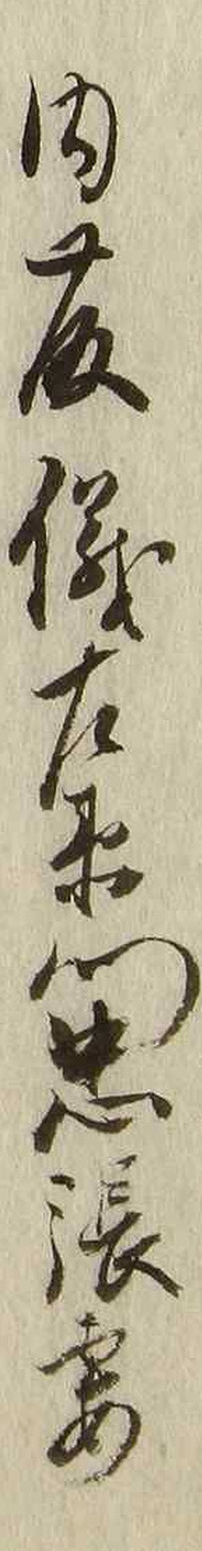女内藤儀左衛門忠張妻
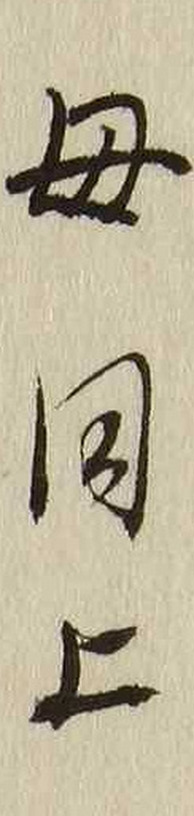母同上
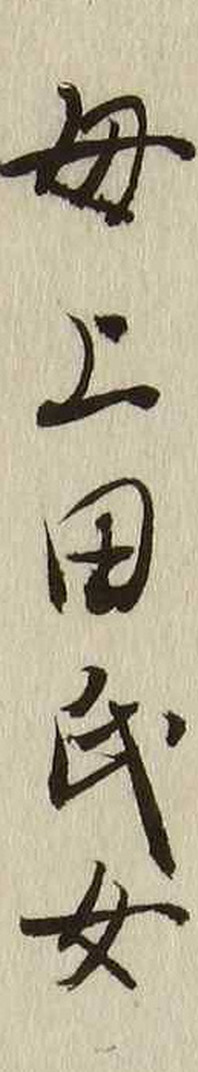母上田氏女
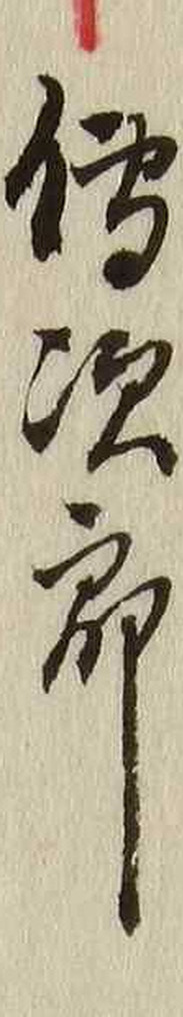伝次郎
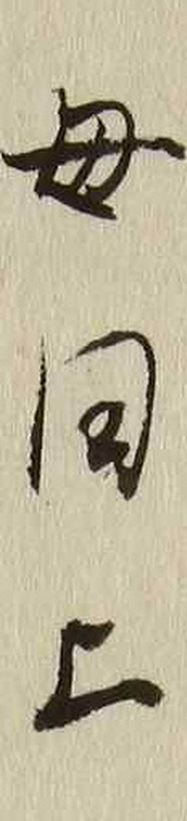母同上
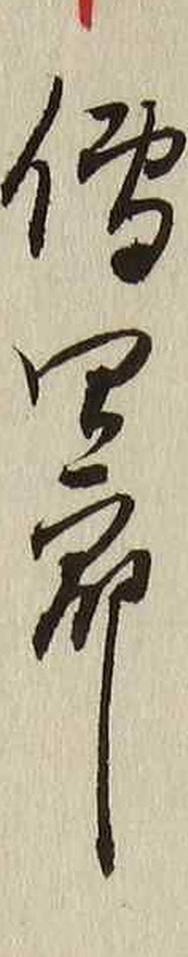伝四郎
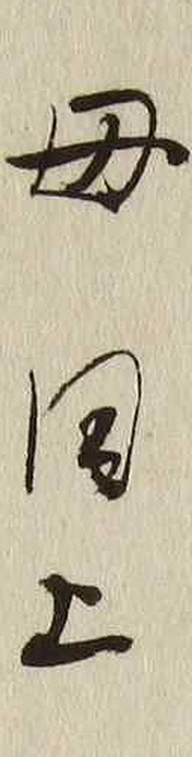母同上
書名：諸士系譜　巻之348　も之部4
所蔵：会津若松市立会津図書館
